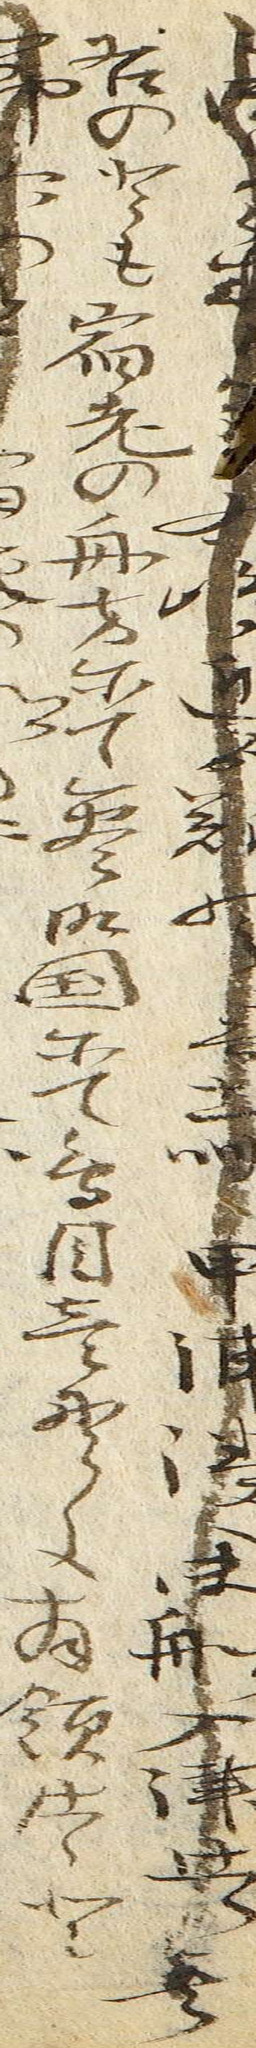右のとも宿老の舟方にて参御国にて鳥目壱貫文拝領仕候と
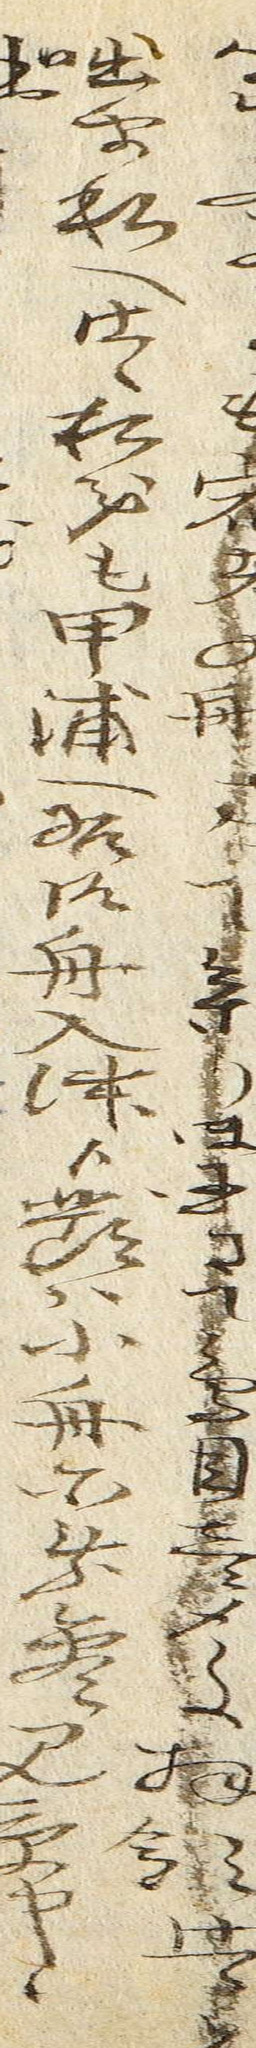咄を私へ仕候私義も甲浦へ右御舟入津候節ハ小舟に乗参見受申候
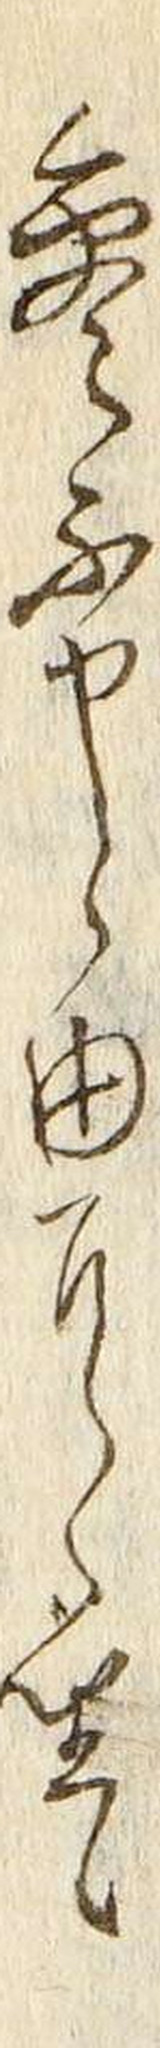参不申候由に御座候
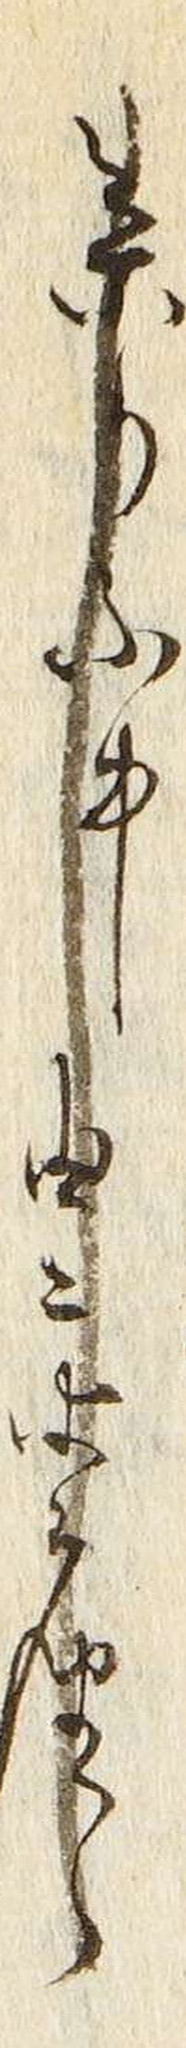参不申候由に御座候
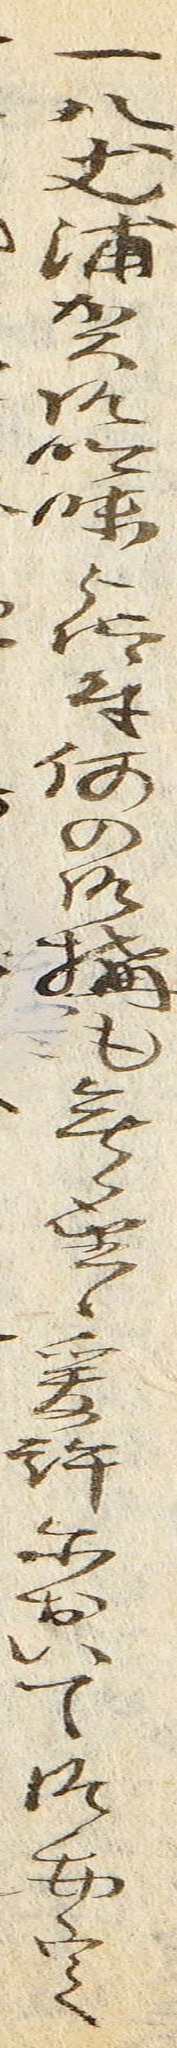一八丈浦賀御吟味被仰付何の御構も無御座候爰許において御勘定
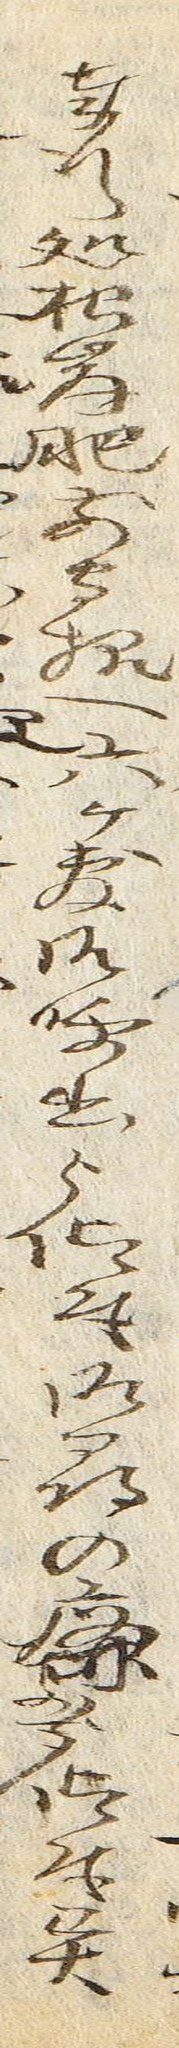奉行処松岸肥前守様へ六ケ敷御呼出被仰付御尋の廉被仰付異
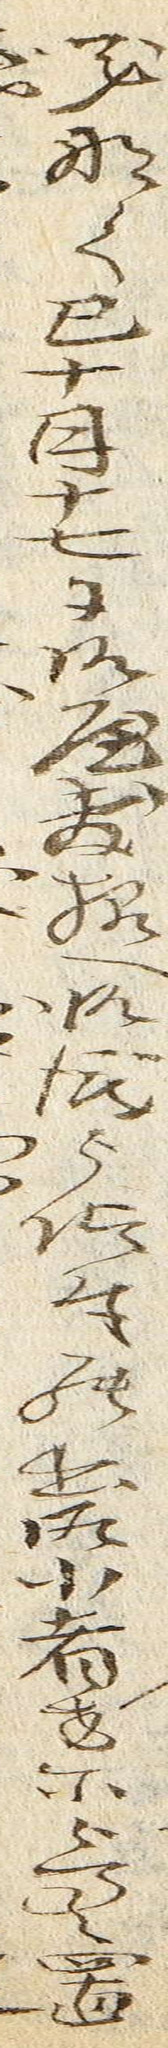義なく巳十月十七日御屋敷様へ御渡被仰付罷出御小者方に被差置
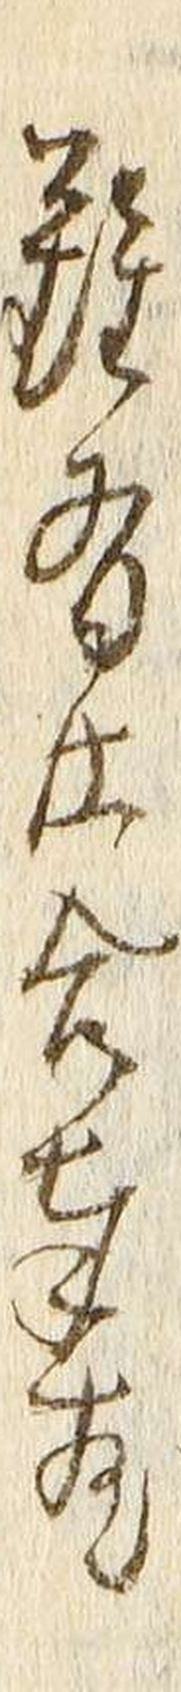難有仕合奉存候
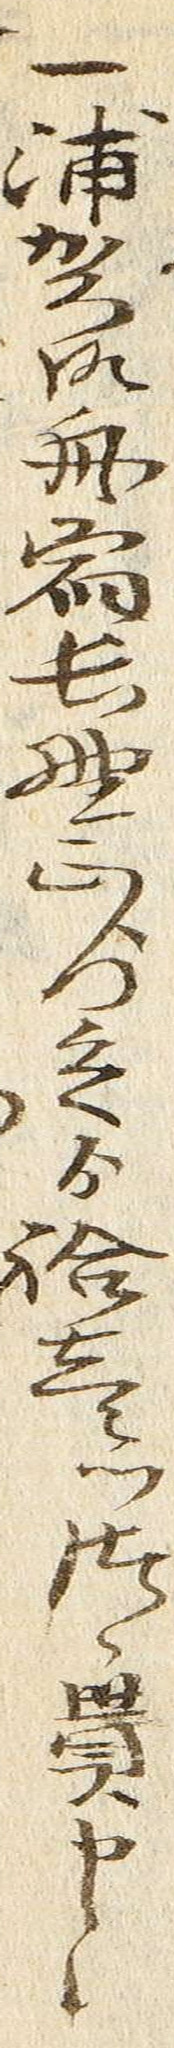一浦賀御舟宿長野正右衛門殿ゟ袷壱ツつゝ貰申候
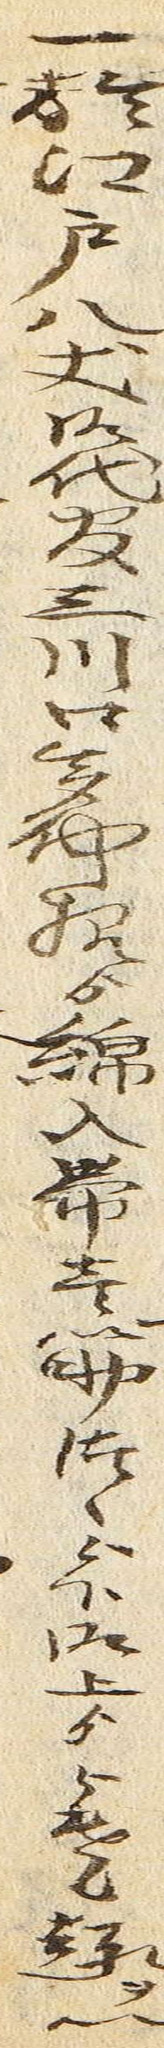一於江戸八丈御代官三川口多仲様ゟ綿入帯壱筋つゝ被下御上ゟ被遣候趣ヲ以
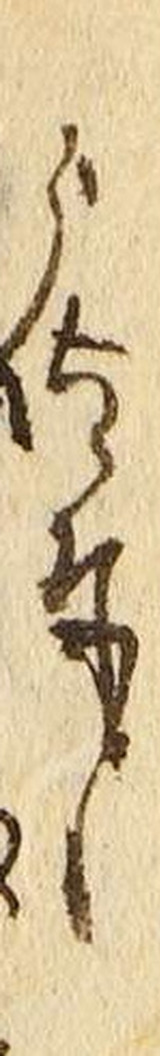被仰付候
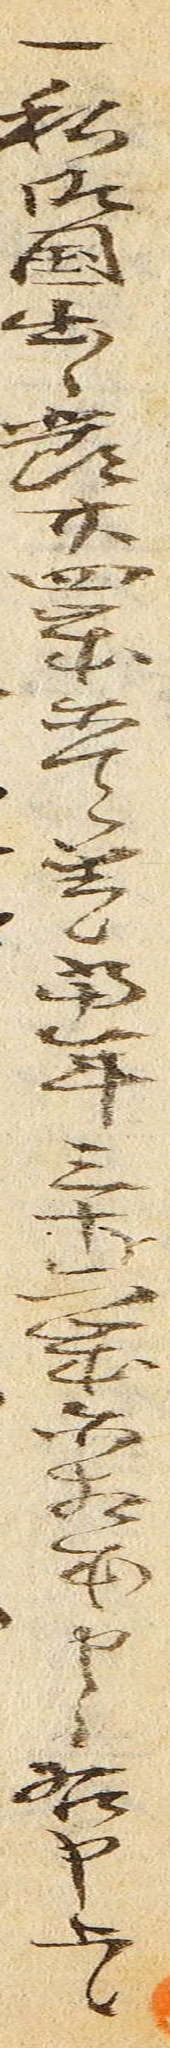一私御国出候節廿四歳にて御座候当年三十六歳に相成申候右申上候
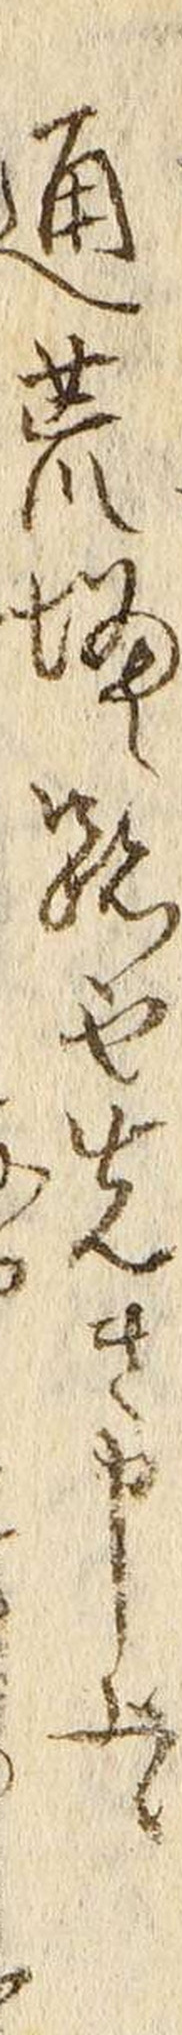通荒増跡や先き申上候
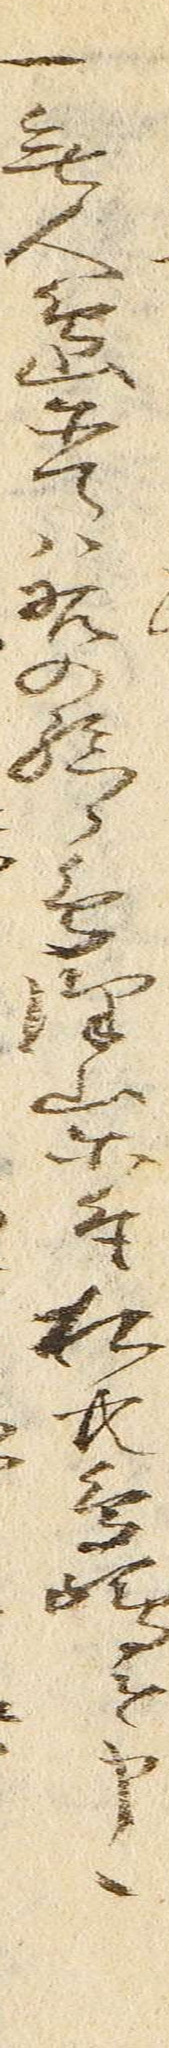一無人島にてハ右の給候鳥沢山ニ付私共鳥嶋と申候
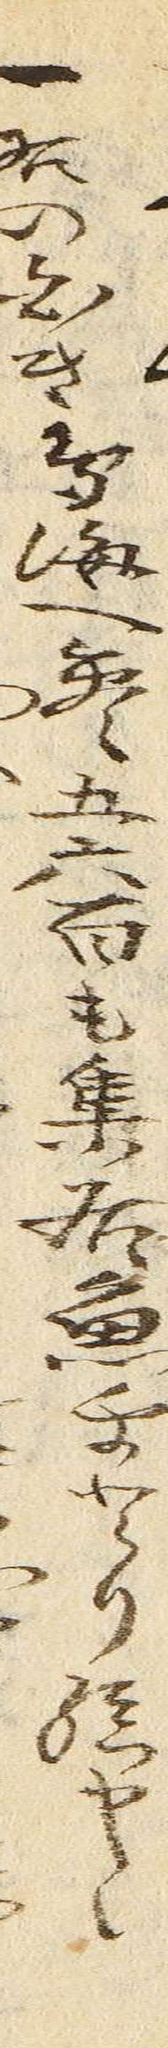一右の白き鳥海へ参五六百も集居魚をとり給申候
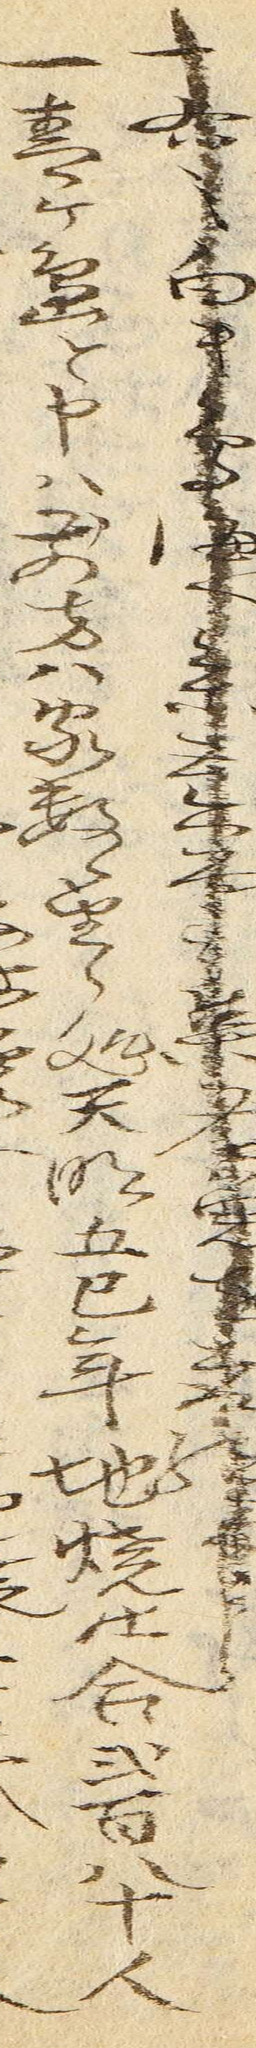一青ケ島と申ハ前方ハ家数御座候処天明五巳年地焼仕合弐百八十人
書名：無人島漂流書付
